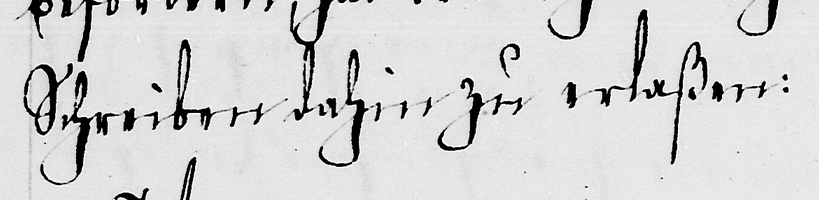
Schreiben dahin zu erlaßen:
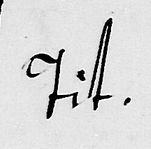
Tit.
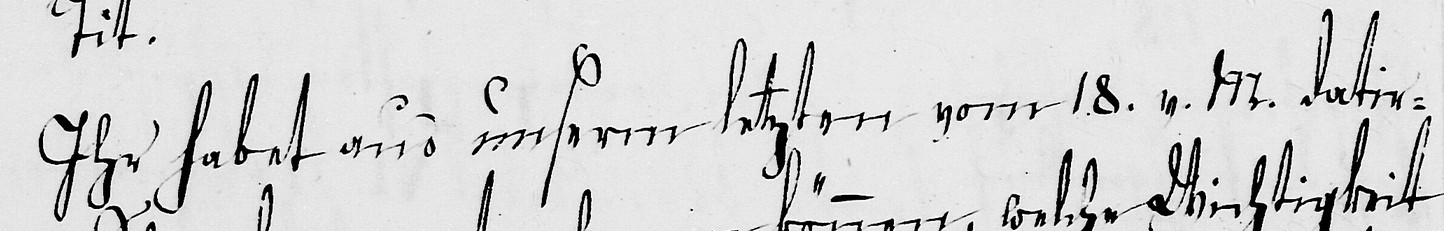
Ihr habet aus unserm letzten vom 18. v. M. datir¬
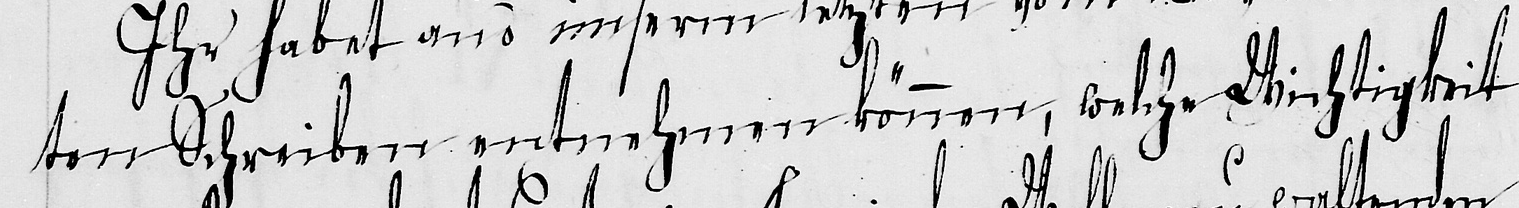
ten Schreiben entnehmen können, welche Wichtigkeit
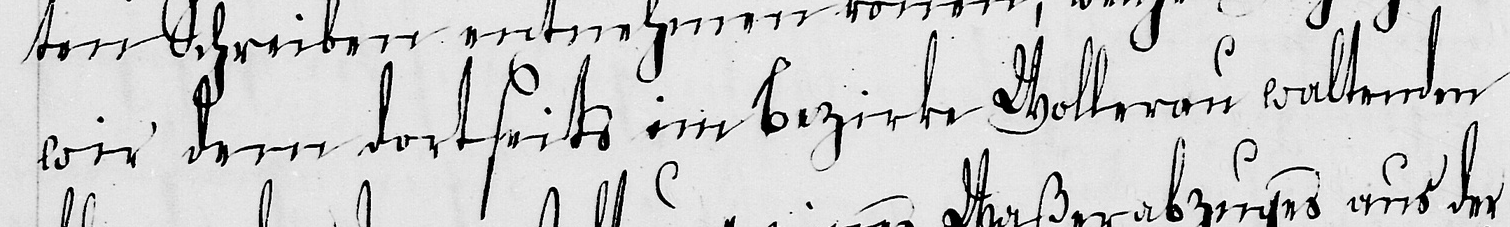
wir dem dortseits im Bezirke Wollerau waltenden
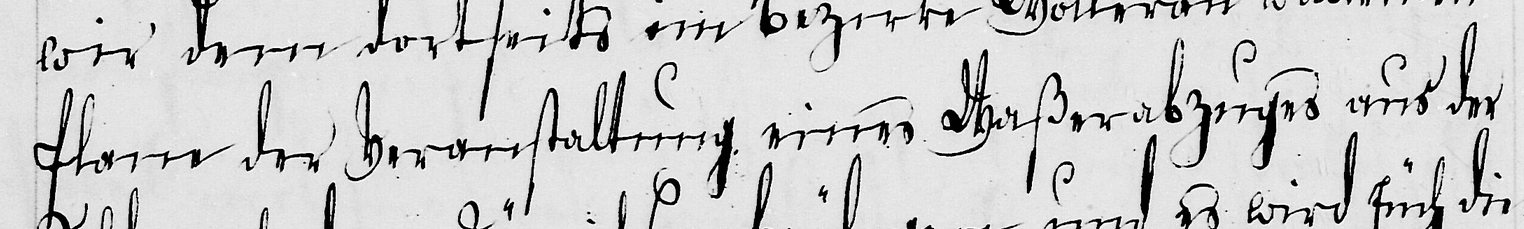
Plane der Veranstaltung eines Waßerabzuges aus der
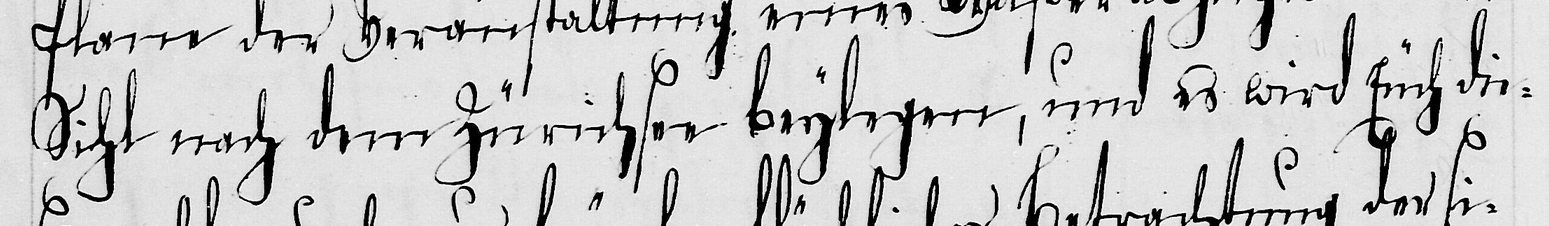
Sihl nach dem Zürichsee beylegen, und es wird Euch di¬
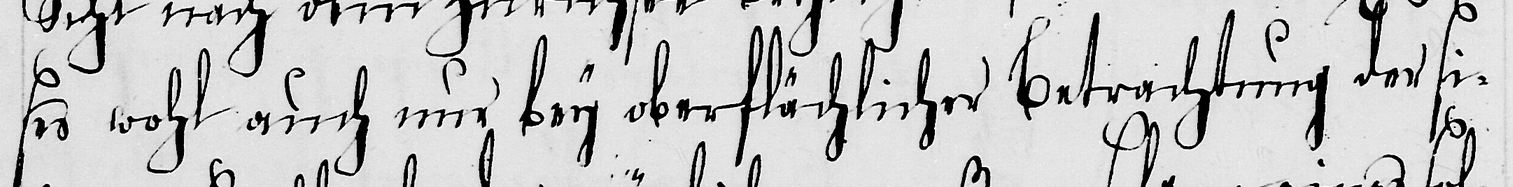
ses wohl auch nur bey oberflächlicher Betrachtung der si¬
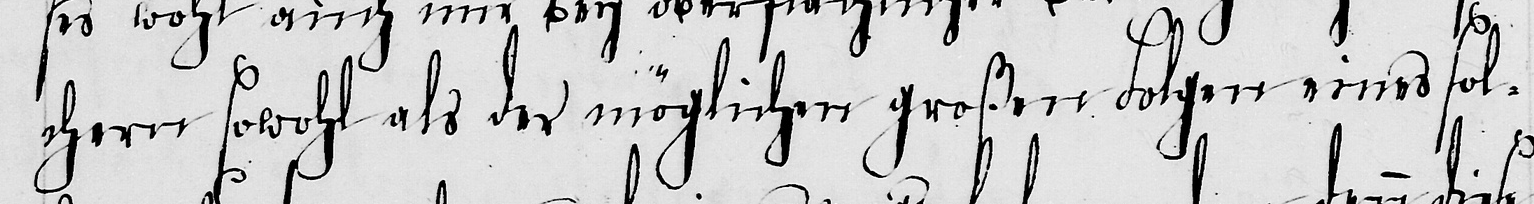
chern sowohl als der möglichen großen Folgen eines sol¬
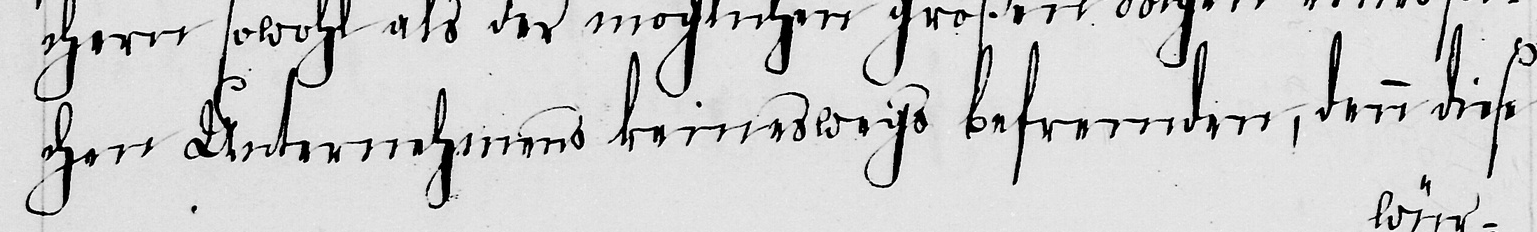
chen Unternehmens keineswegs befremden, denn diese
